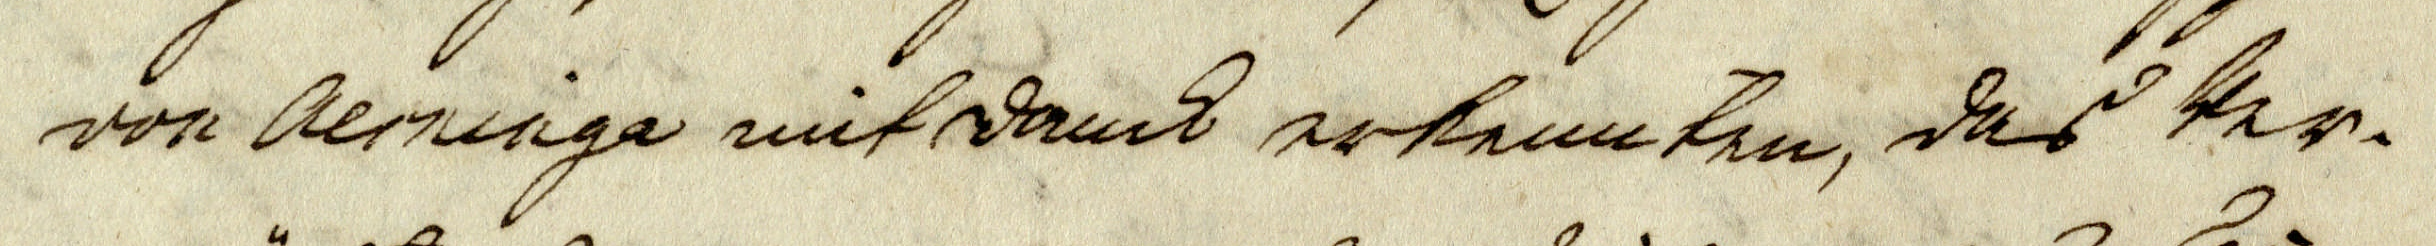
von Aeminga mit Danck erkennten, das Ver¬
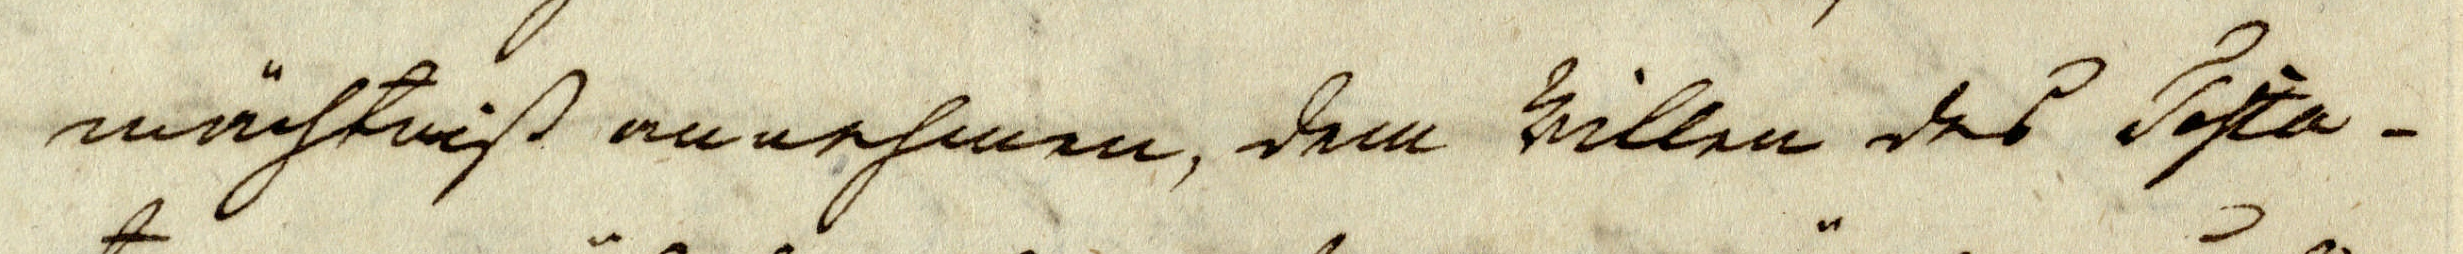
mächtniß annehmen, dem Willen des Testa¬
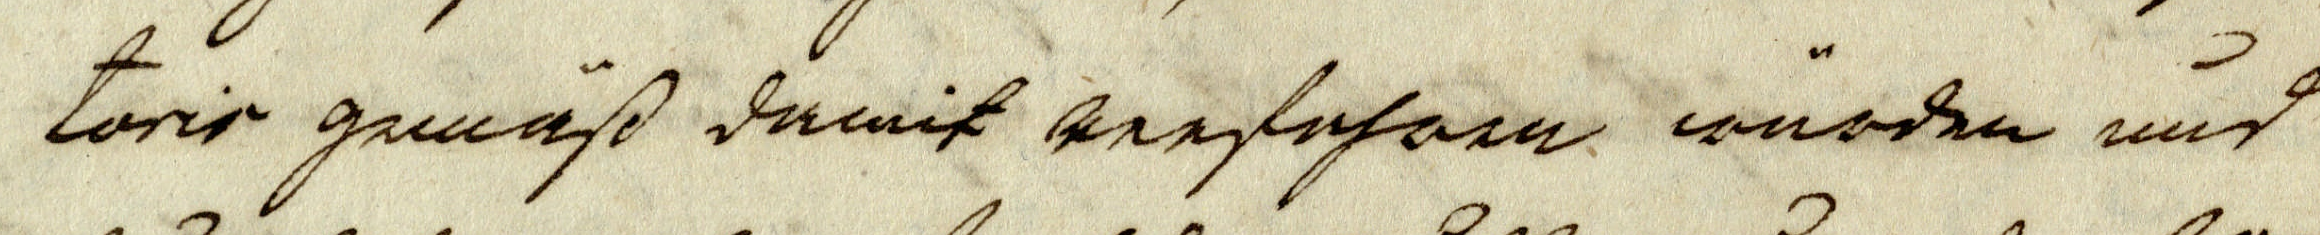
toris gemäß damit verfahren würden und
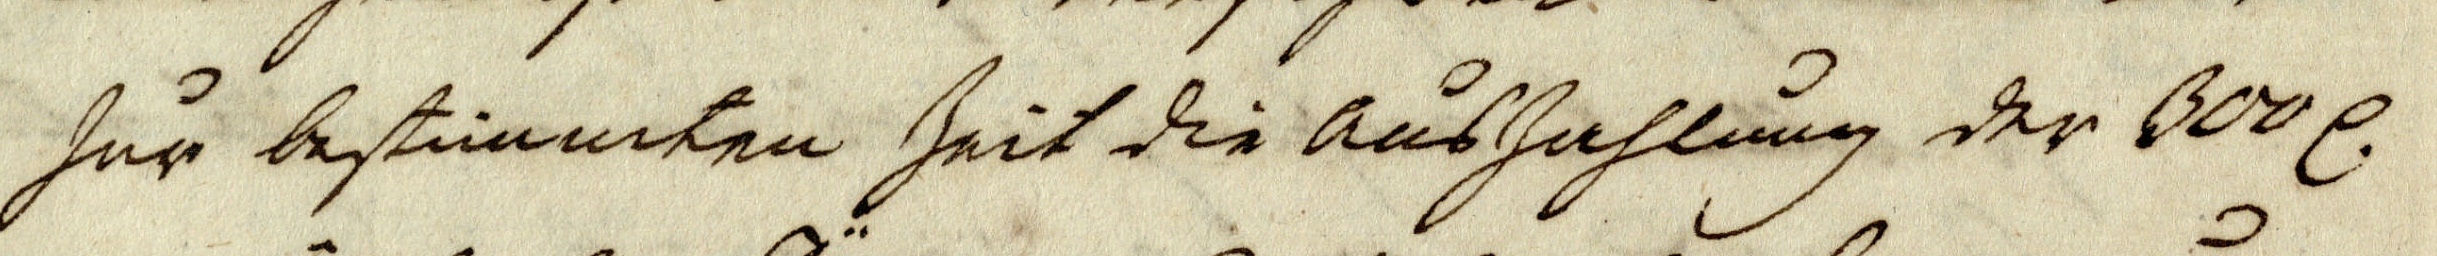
zur bestimmten Zeit die Auszahlung der 300 l.
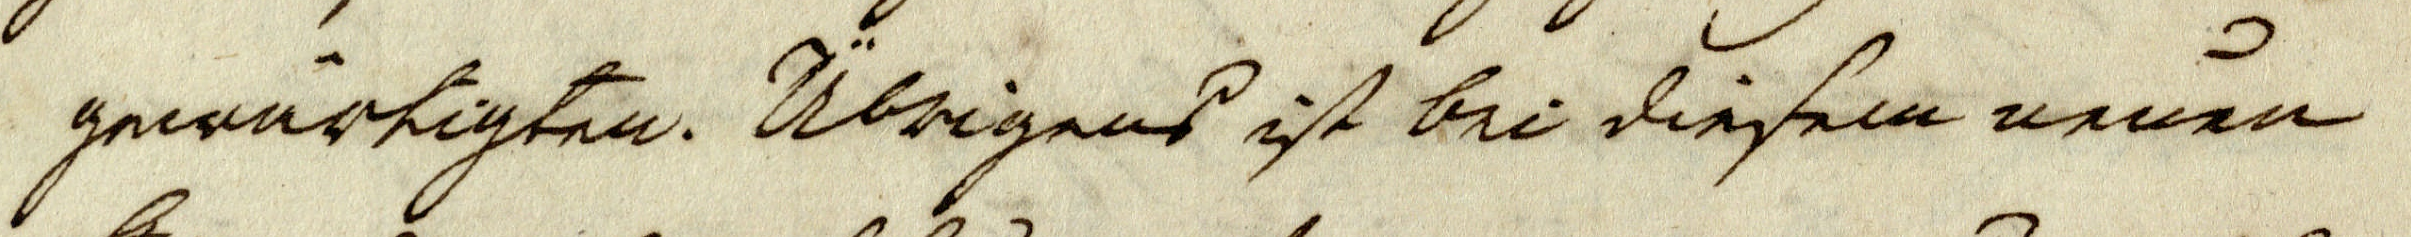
gewärtigten. Übrigens ist bei diesem neuen
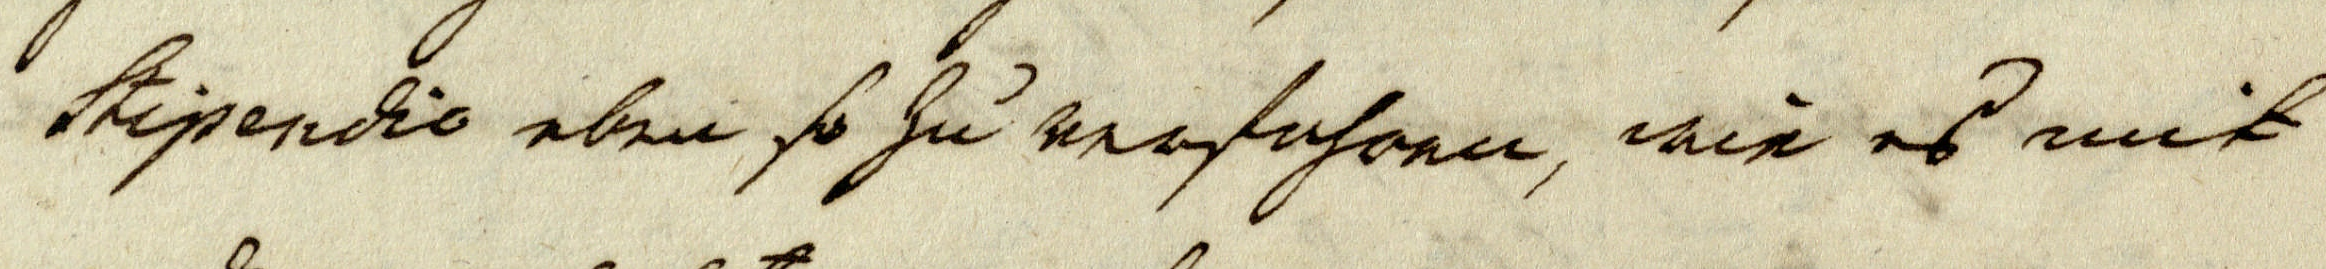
Stipendio eben so zu verfahren, wie es mit
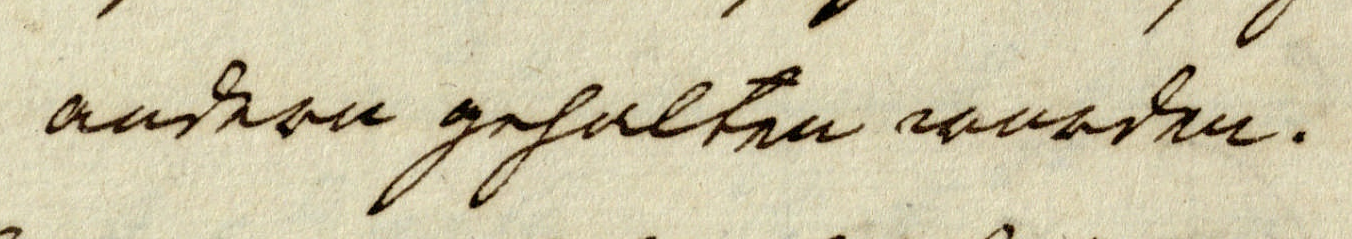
andern gehalten worden.
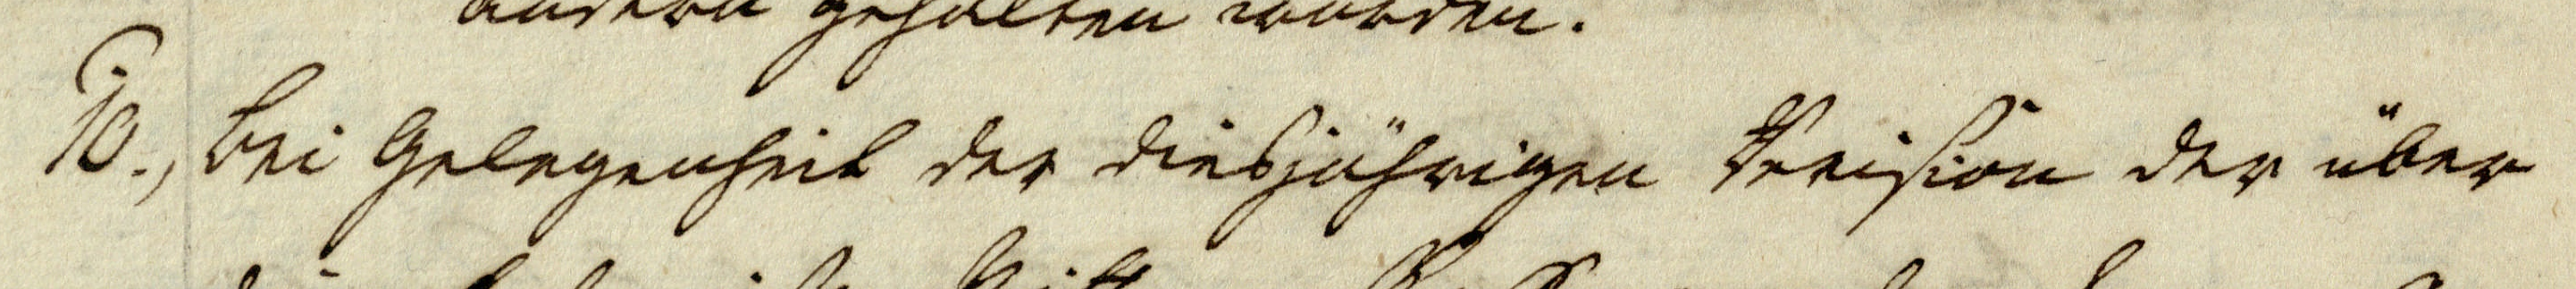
10., Bei Gelegenheit der diesjährigen Revision der über
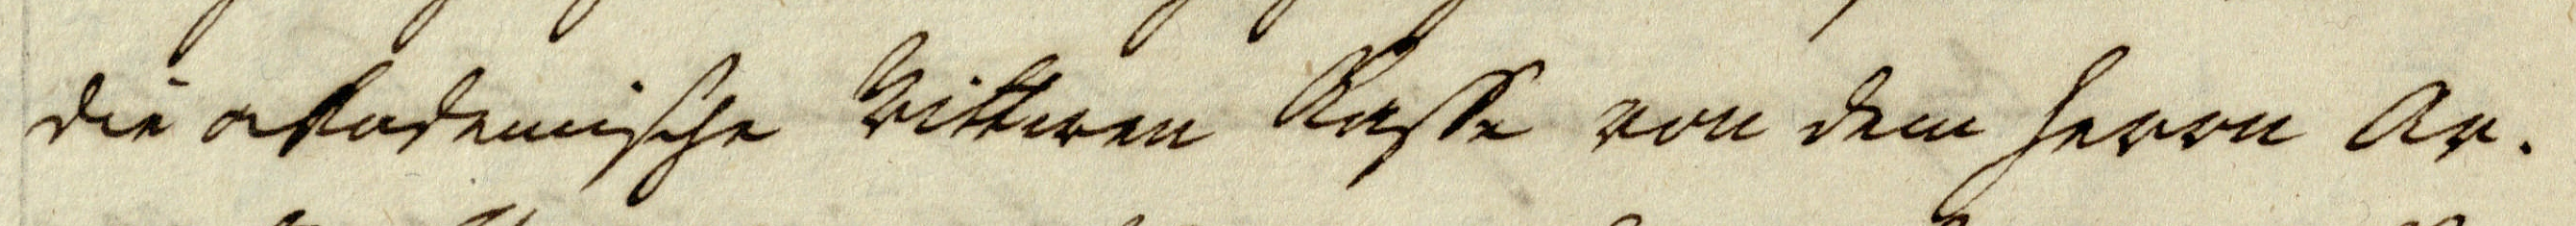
die akademische Wittwen Kasse von dem Herrn Ar¬
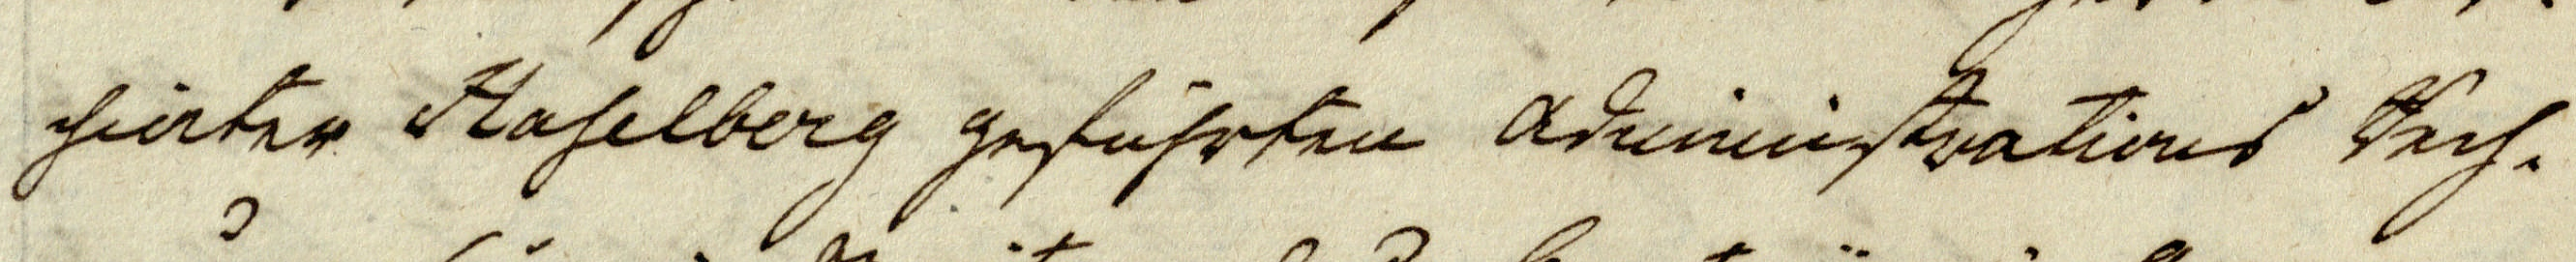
chiater Haselberg geführten Administrations Rech¬
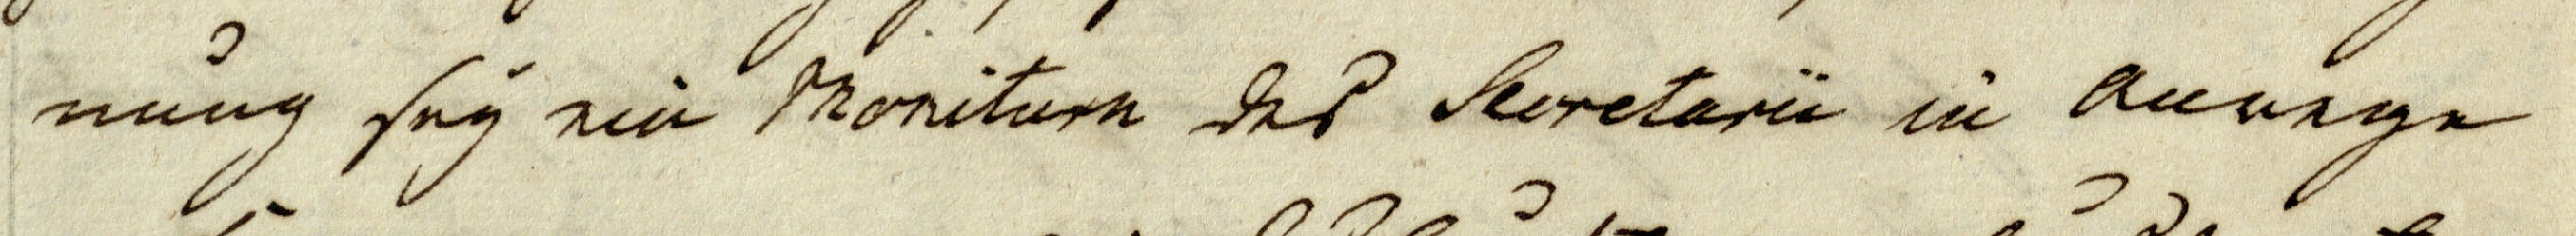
nung seÿ ein Monitum des Secretarii in Anrege
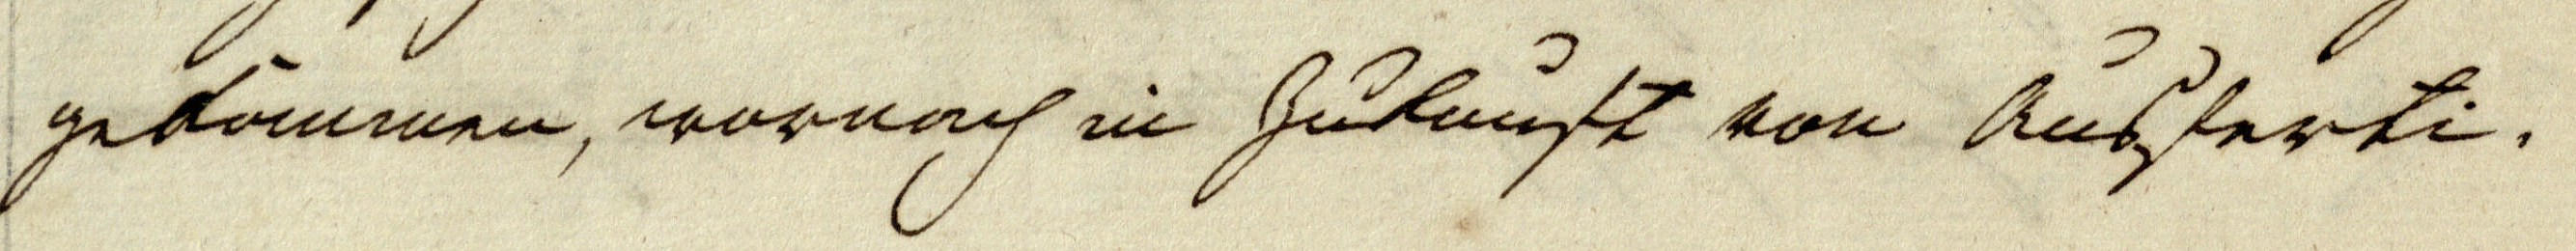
gekommen, wornach in Zukunft von Ausferti¬
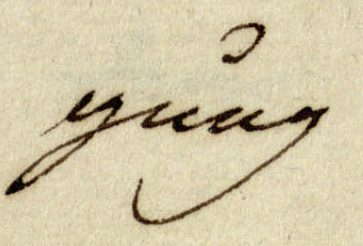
gung
